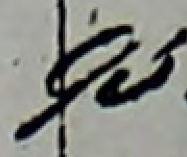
95
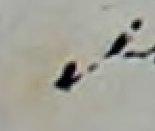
do
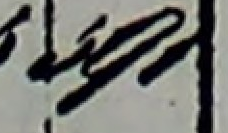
591
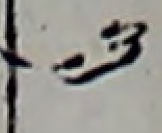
3
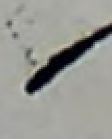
1
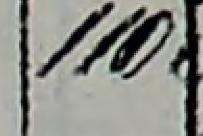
110
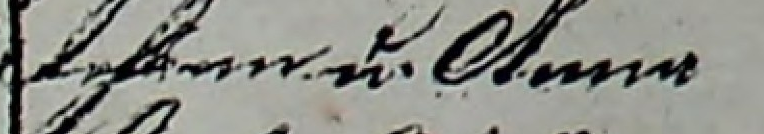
Johann u. Anna
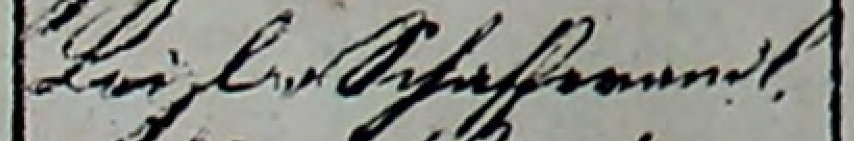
Loizl v. Schafferandl.
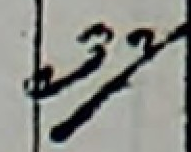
37
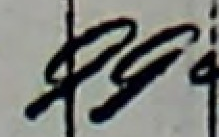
99
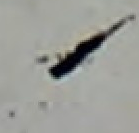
1
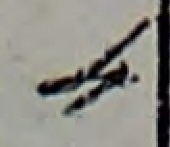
4
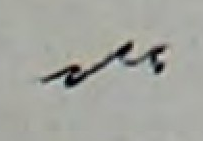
do
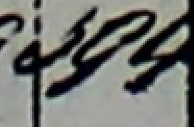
594
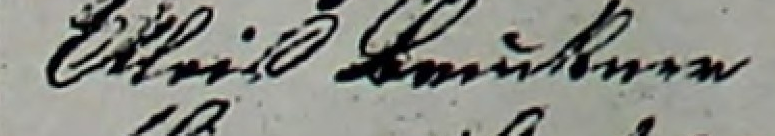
Alois Bruckner
